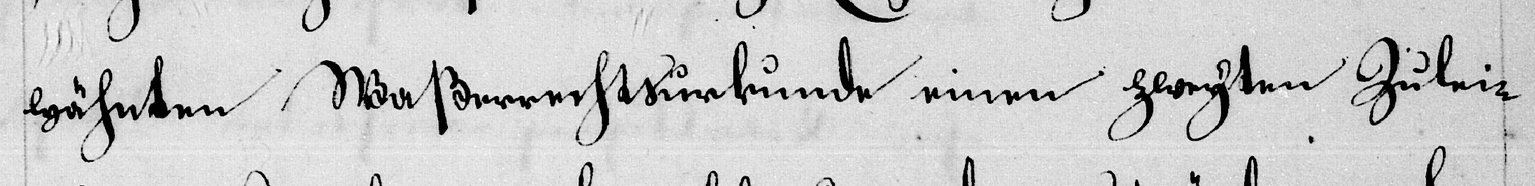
wähnten Waßerrechtsurkunde einen zweyten Zulei¬
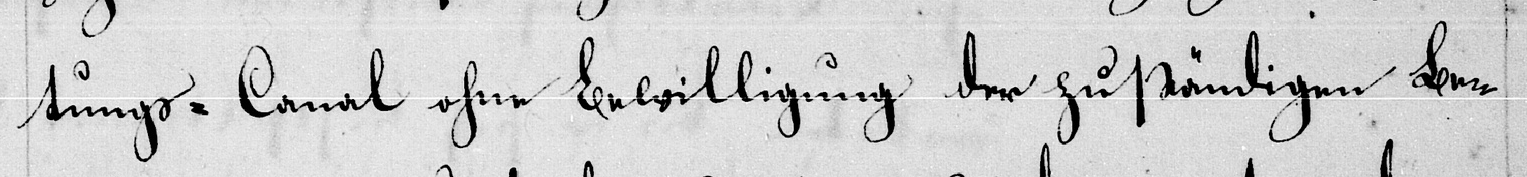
tungs-Canal ohne Bewilligung der zuständigen Be¬
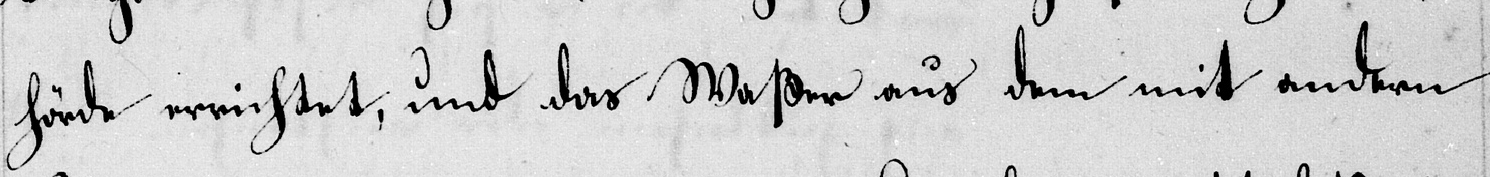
hörde errichtet, und das Waßer aus dem mit andern
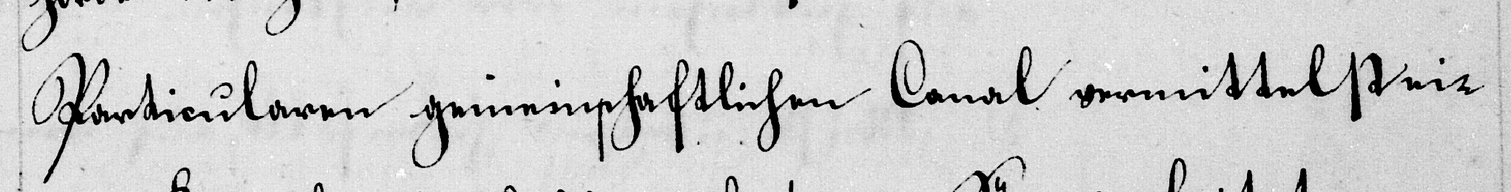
Particularen gemeinschaftlichen Canal vermittelst ei¬
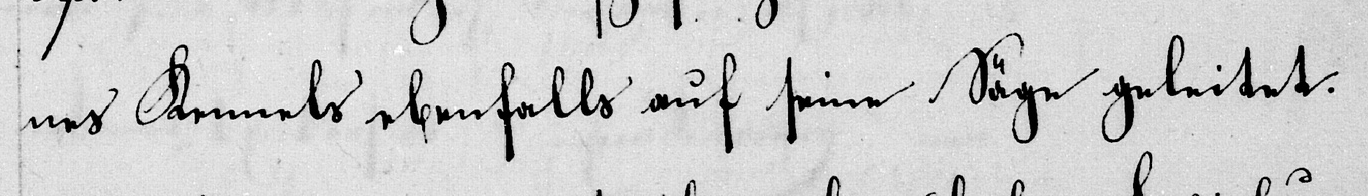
nes Kennels ebenfalls auf seine Säge geleitet.
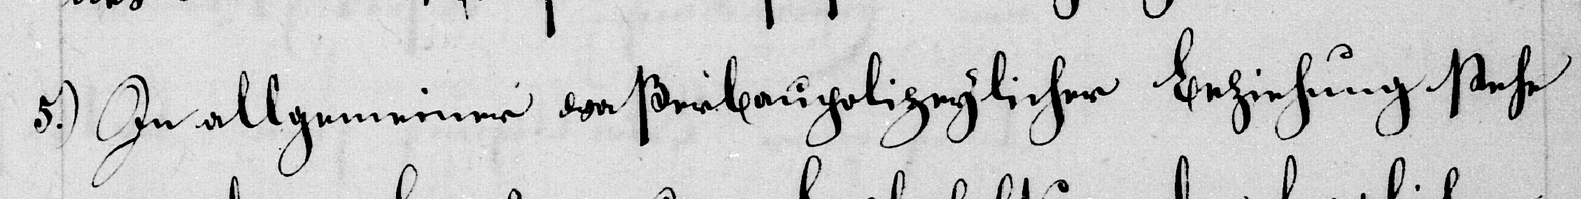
5.) In allgemeiner waßerbaupolizeylicher Beziehung stehe
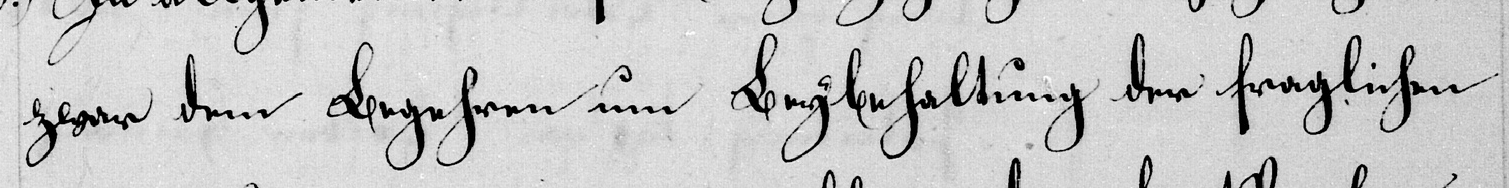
zwar dem Begehren um Beybehaltung der fraglichen
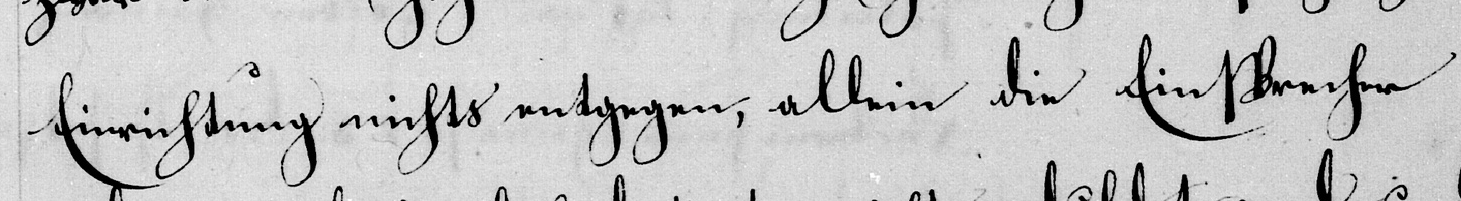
Einrichtung nichts entgegen, allein die Einsprecher
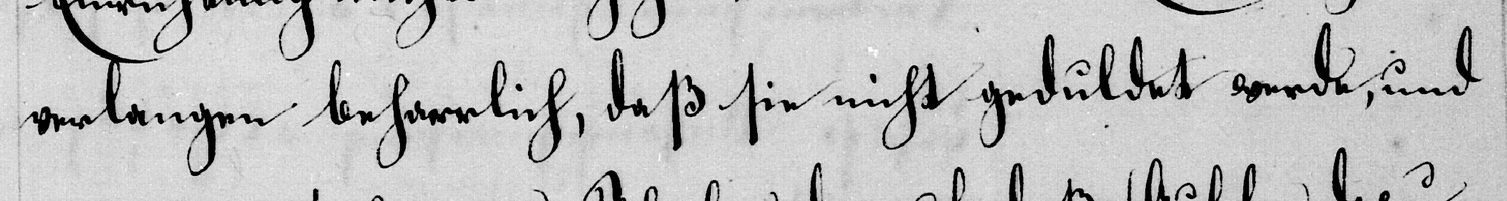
verlangen beharrlich, daß sie nicht geduldet werde, und
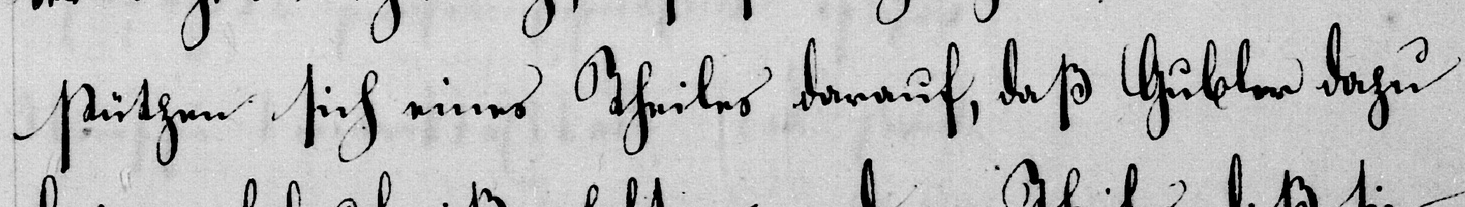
stützen sich eines Theiles darauf, daß Gubler dazu
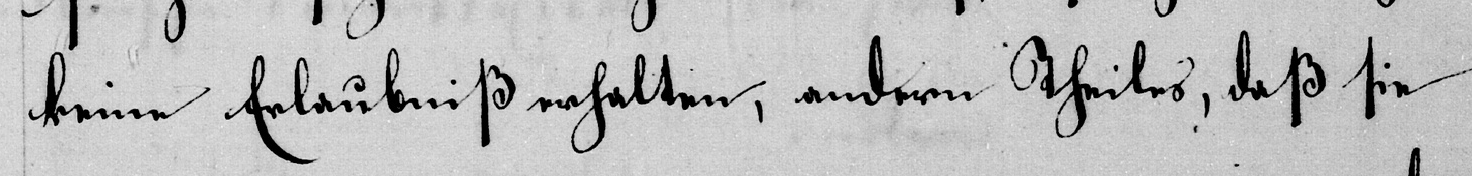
keine Erlaubniß erhalten, andern Theiles, daß sie
